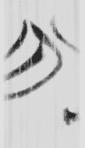分
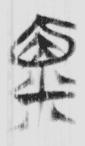粟
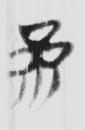參
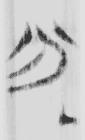分
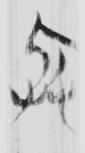兵
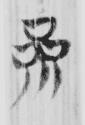參
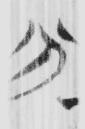分
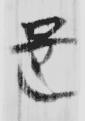是
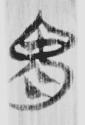胃
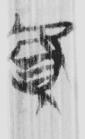{虍貝}
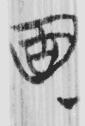固
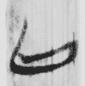㠯（以）
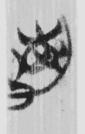{艸叀力}
